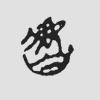皆
